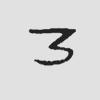乃
